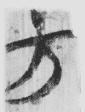方
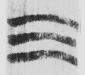三
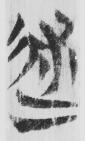述
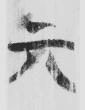亓
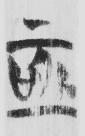亟
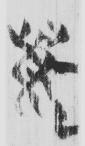{鼠一}
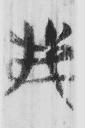弗
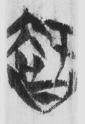智
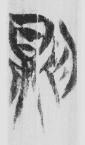則
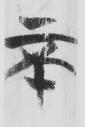不
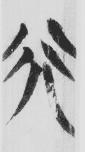行
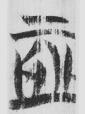亟
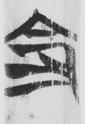命
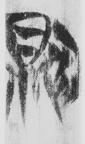則
